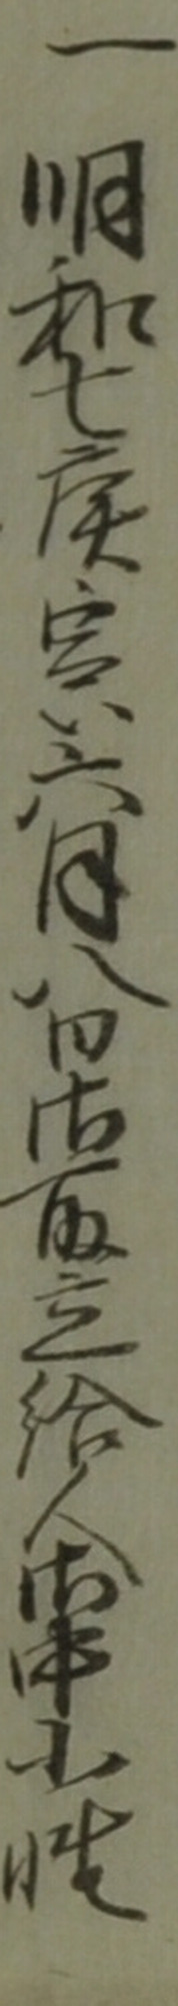一明和七庚寅六月八日御取立給人御中小性
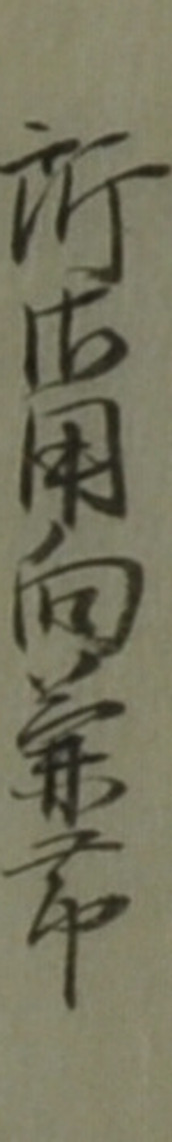所御用向兼帯
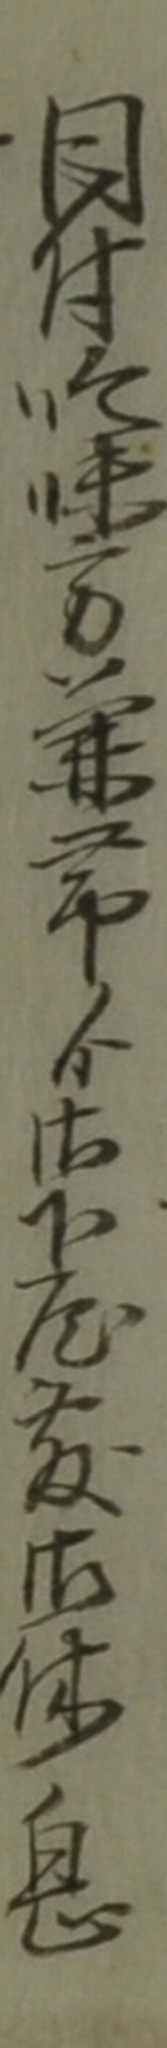目付吟味方兼帯ゟ御下屋敷御休息
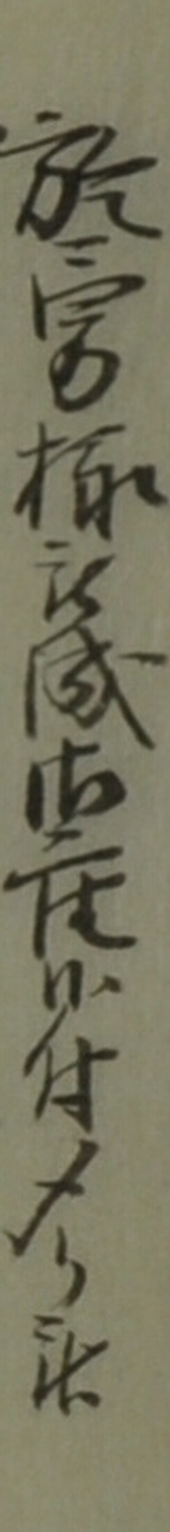於勇様被成御座候付〆り被
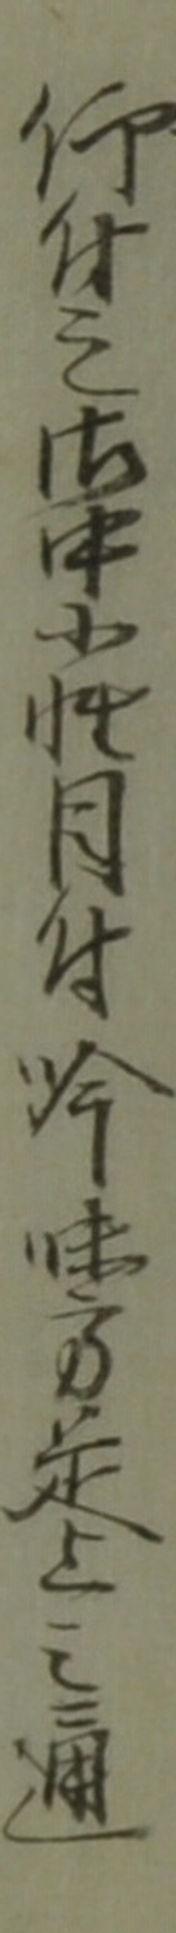仰付之御中小性目付吟味方是迄之通

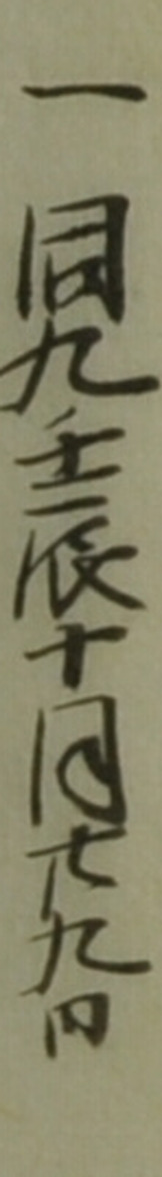一同九壬辰十月廿九日
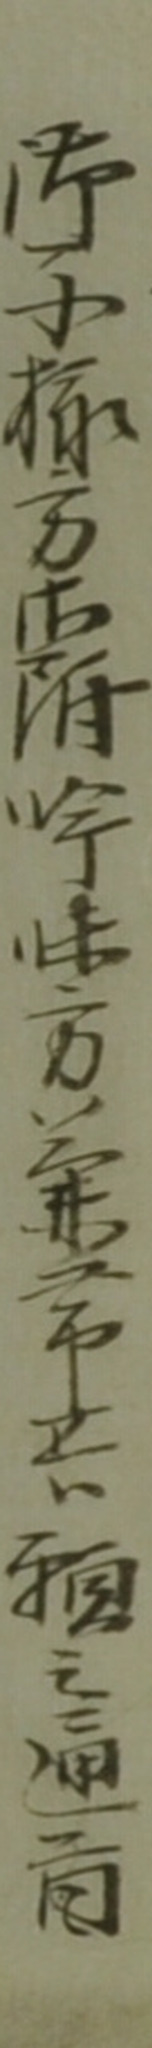御子様方御附吟味方兼帯共願之通首
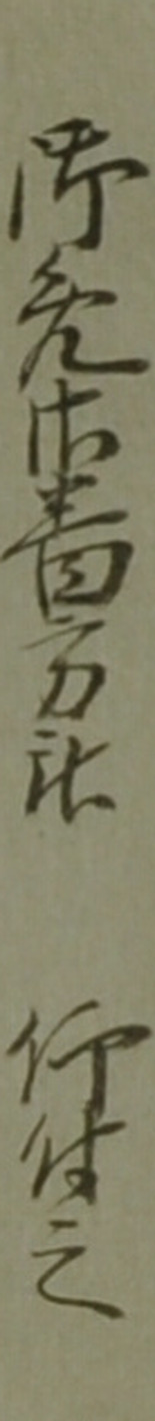御免御番方被仰付之
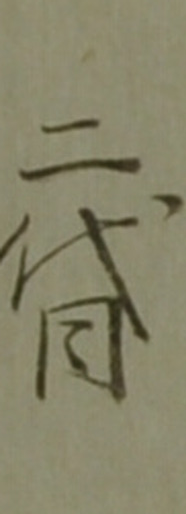二代目
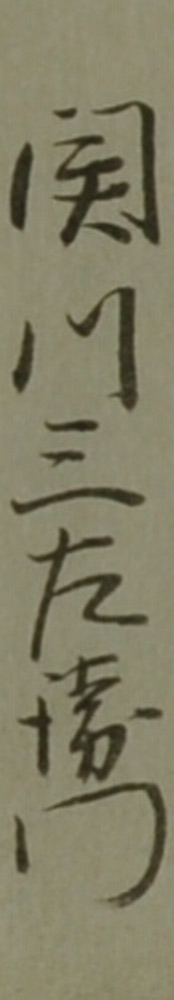関川三左衛門
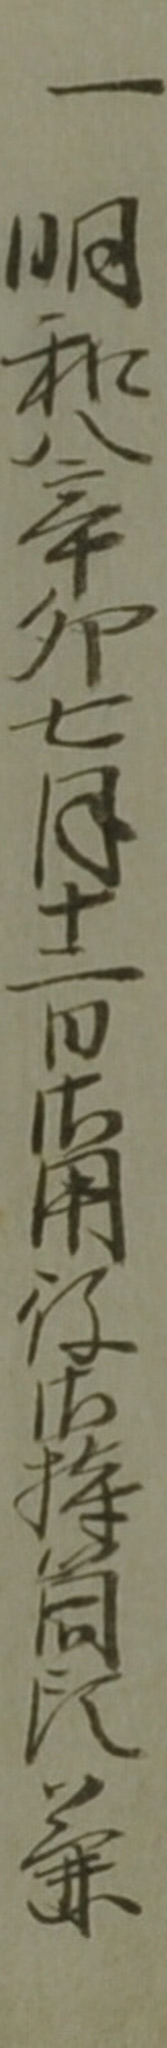一明和八辛卯七月十二日御用役御持筒頭兼
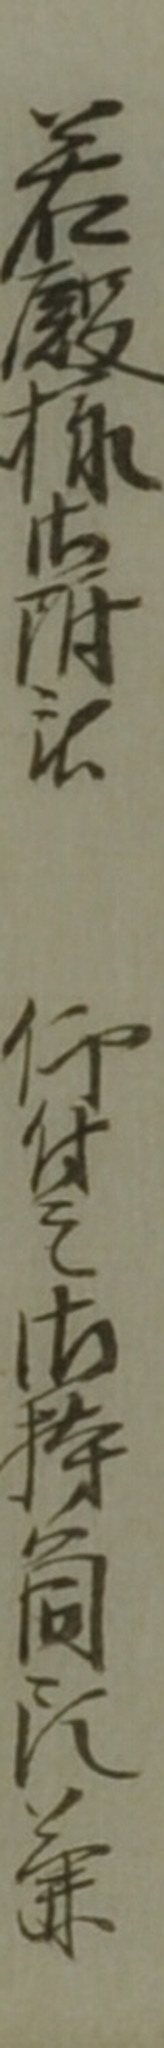若殿様御附被仰付之御持筒頭兼
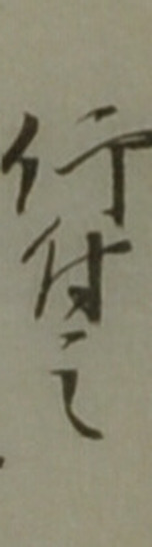仰付之
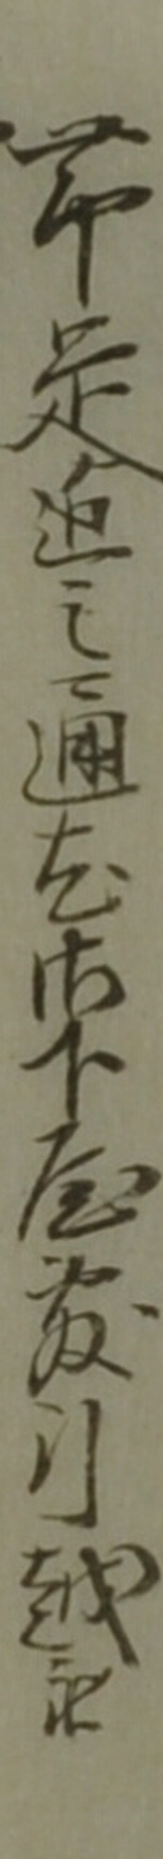帯是迄之通尤御下屋敷引越被
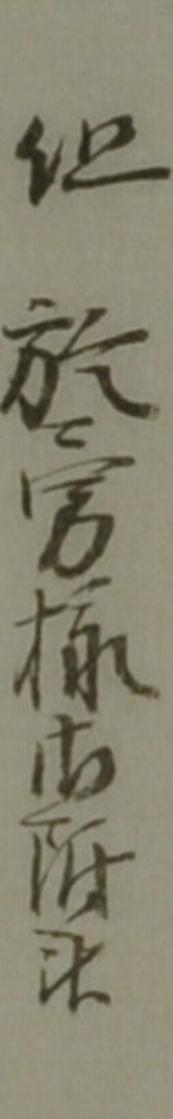但御勇様御附被
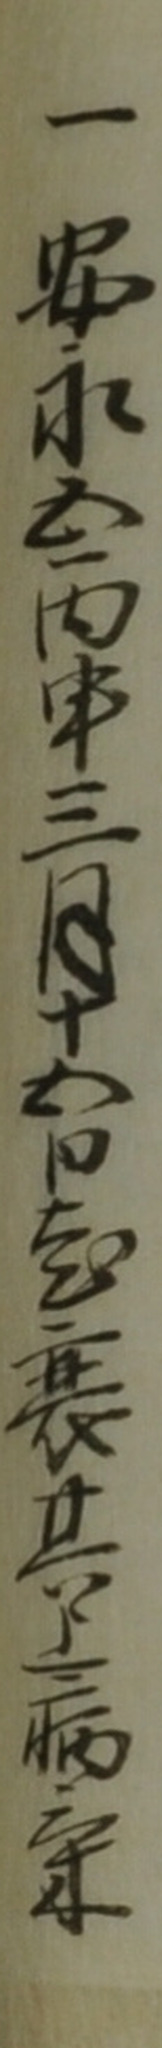一安永五丙申三月十五日老衰其上病気
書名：諸御役代々録（六）
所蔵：伊那市立高遠町図書館・合同会社AMANE
